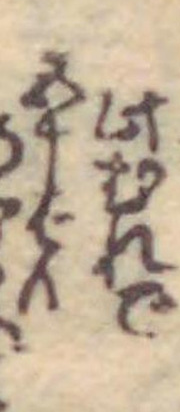此むれで
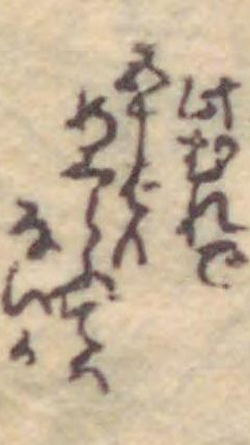めくらふては
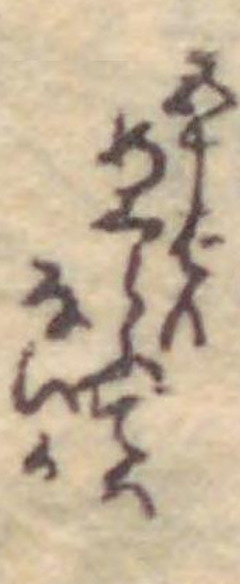めくらふては
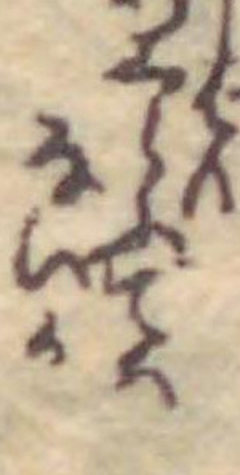ないか
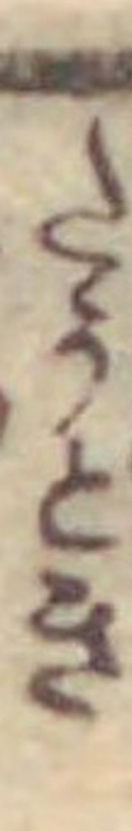たうとき
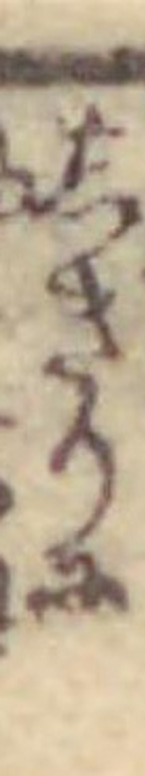しきりに
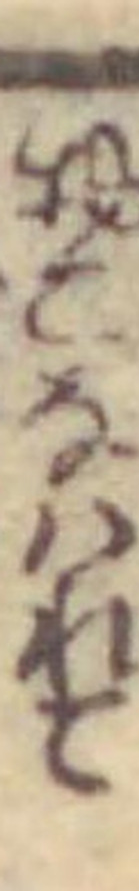おこなはれて
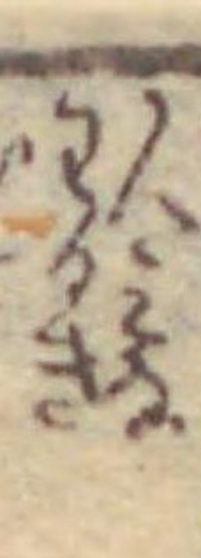わるき
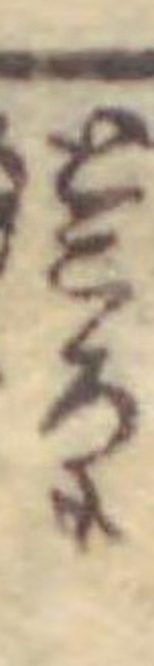ところも
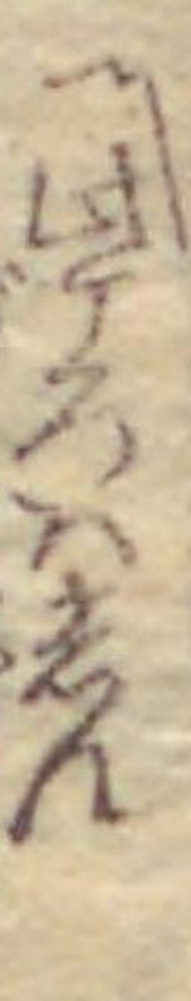〽此ころはしん
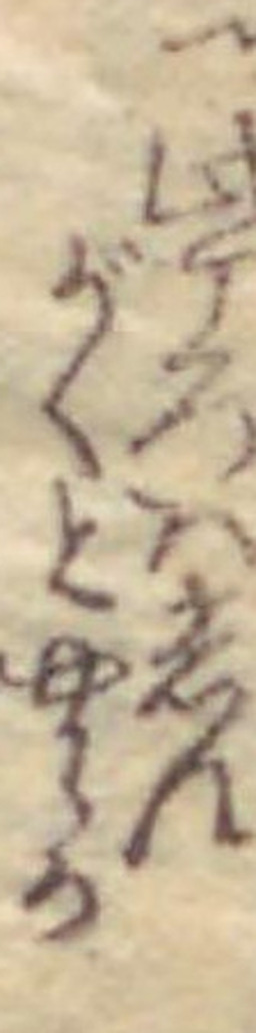がくとやらか
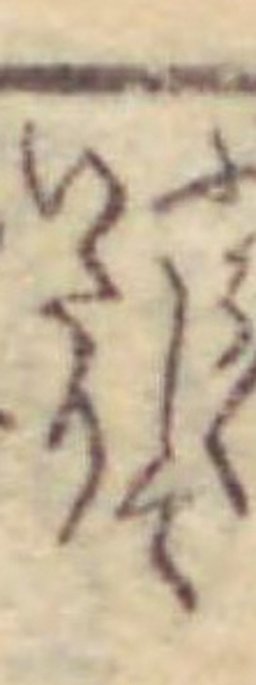いたり
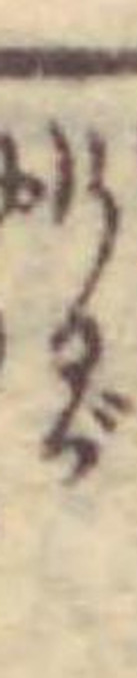けるが
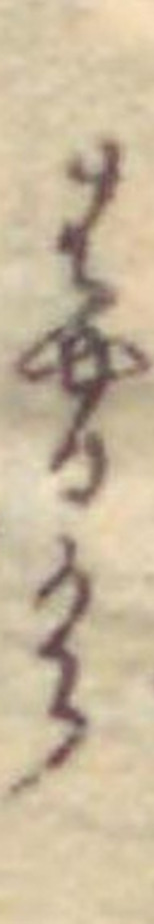はやるから
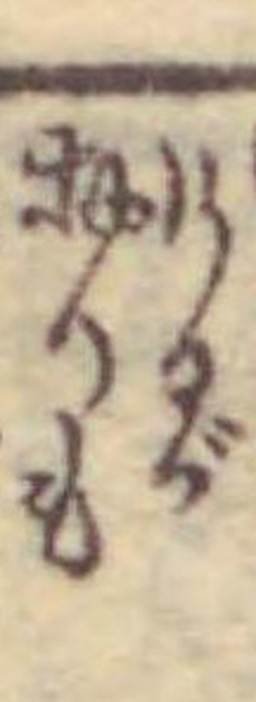おりも
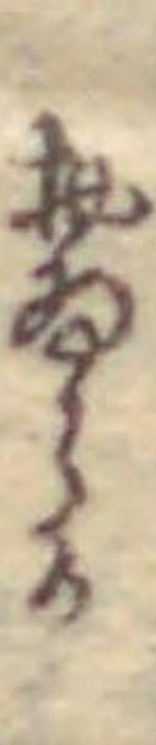おゐらか
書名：心学早染艸 : 3巻
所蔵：国立国会図書館 National Diet Library, JAPAN
